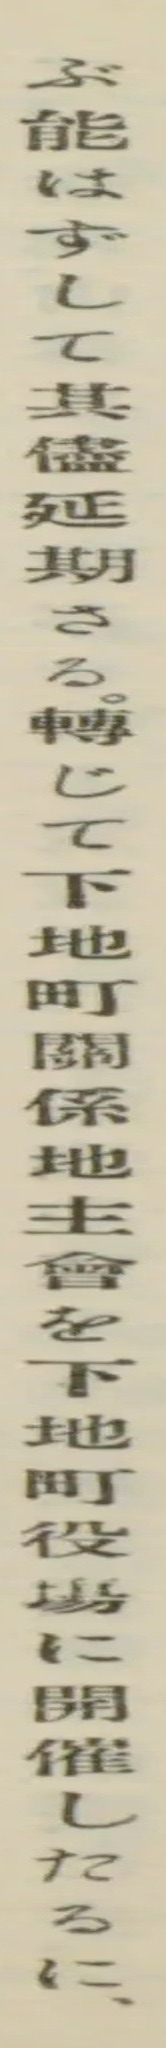ぶ能はずして其儘延期さる。転じて下地町関係地主会を下地町役場に開催したるに、
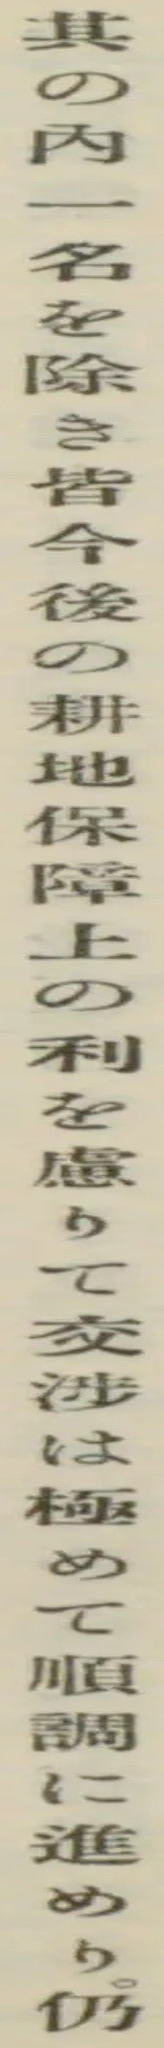其の内一名を除き皆今後の耕地保障上の利を慮りて交渉は極めて順調に進めり。仍
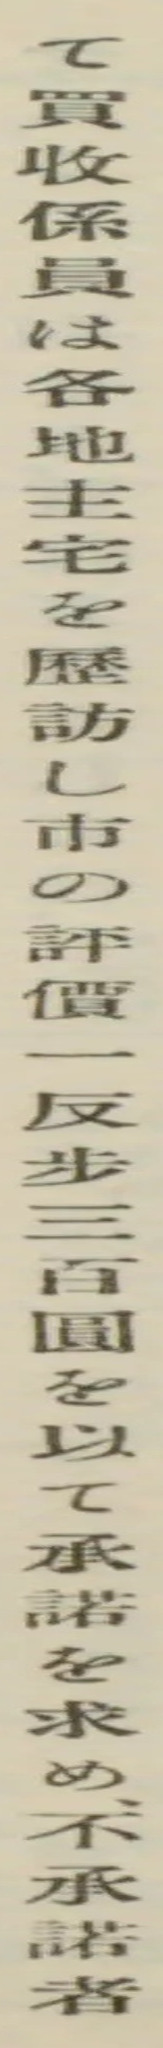て買収係員は各地主宅を歴訪し市の坪価一反歩三百円を以て承諾を求め、不承諾者
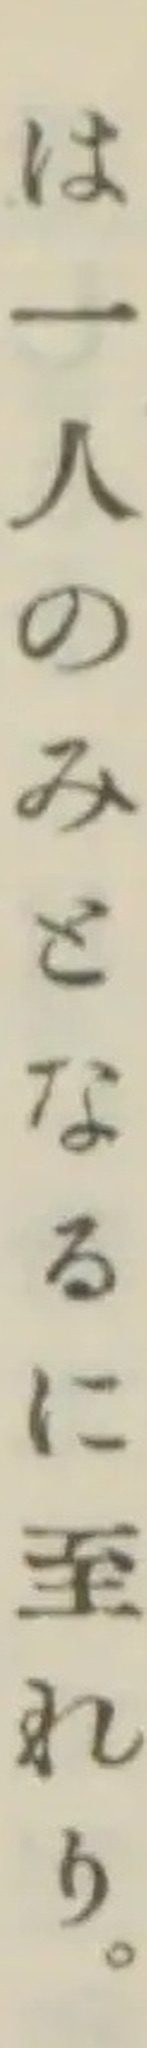は一人のみとなるに至れり。
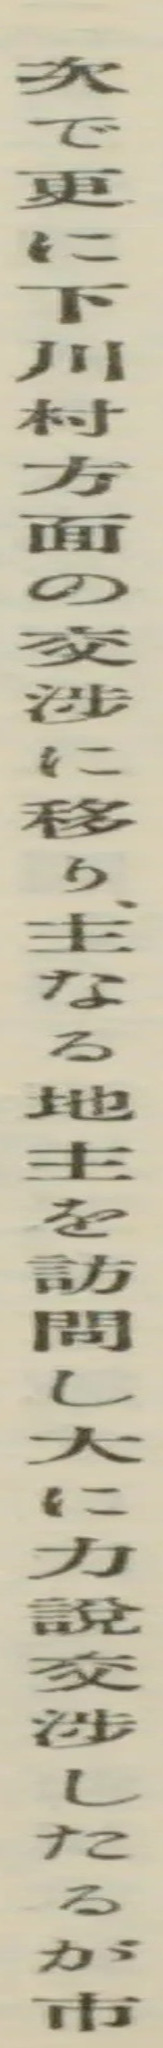次で更に下川村方面の交渉に移り、主なる地主を訪問し大に力説交渉したるが市
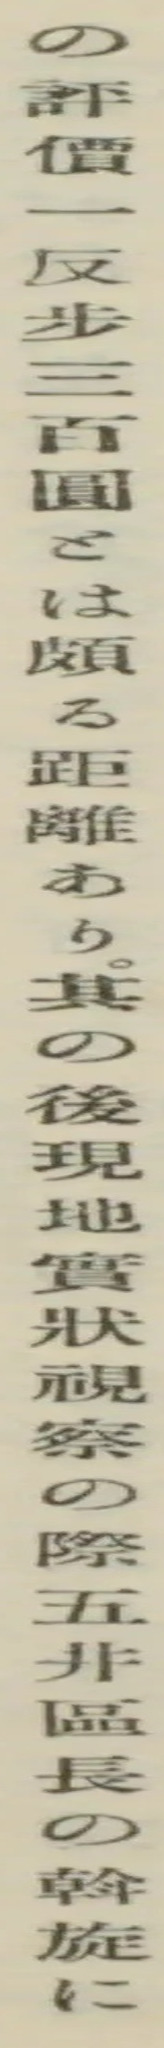の坪価一反歩三百円とは頗る距離あり。其の後現地実情視察の際五井区長の斡旋に
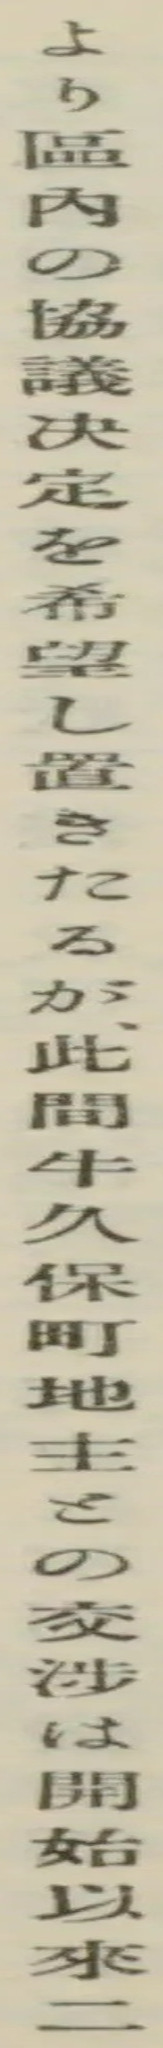より区内の協議決定を希望し置きたるが、此間牛久保町地主との交渉は開始以来二
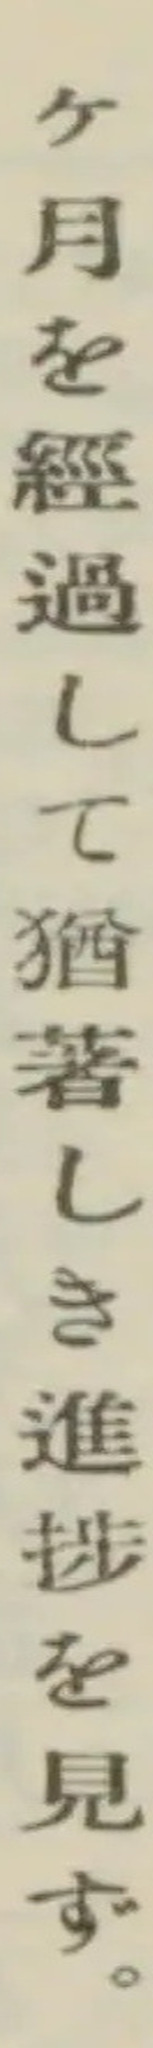ヶ月を経過して猶著しき進捗を見ず。
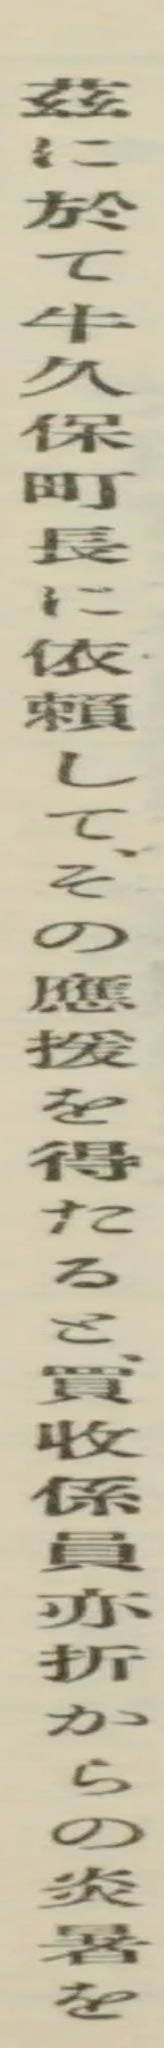茲に於て牛久保ちょう町長に依頼して、その応援を得たると、買収係員亦折からの炎暑を
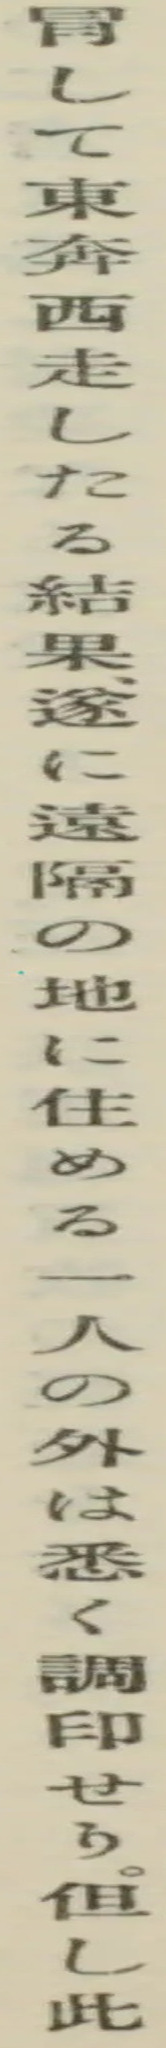冒して東奔西走したる結果、遂に遠隔の地に住める一人の外は悉く調印せり。但し此
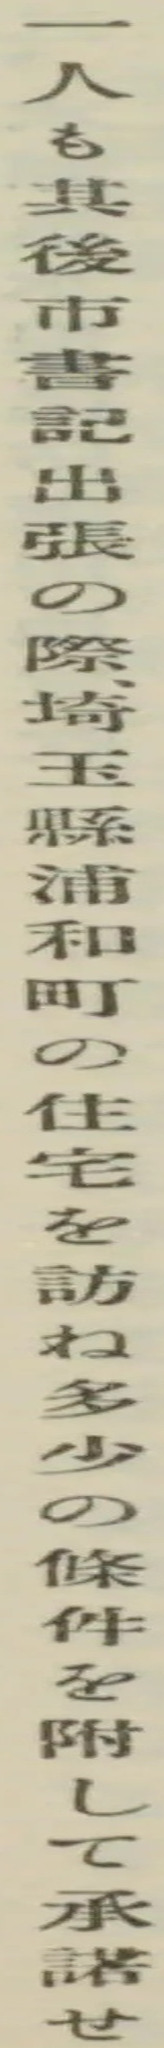一人も其後市書記出張の際、埼玉県浦和町の住宅を訪ね多少の条件を附して承諾せ
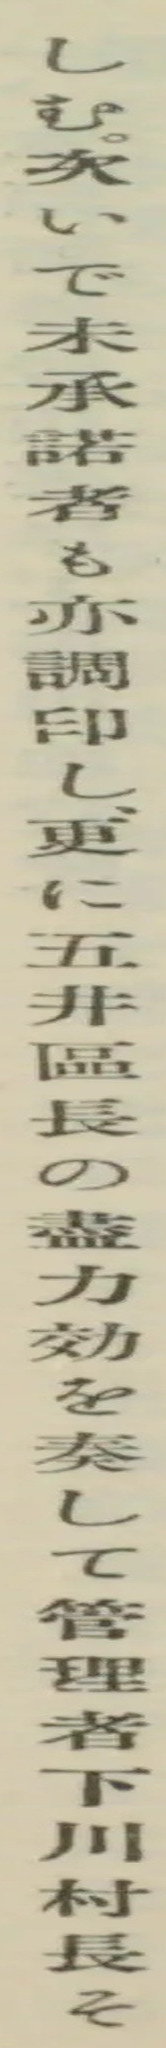しむ。次いで未承諾者も亦調印し、更に五井区長の盡力効を奏して管理者下川村長そ
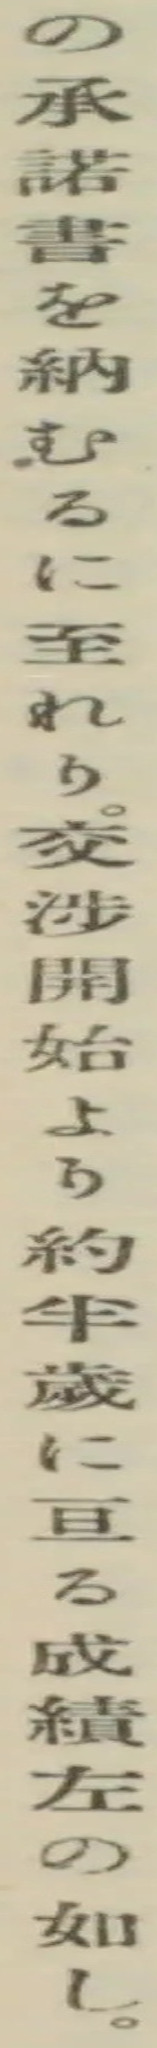の承諾書を納むるに至れり。交渉開始より約半歳に亘る成績左の如し。
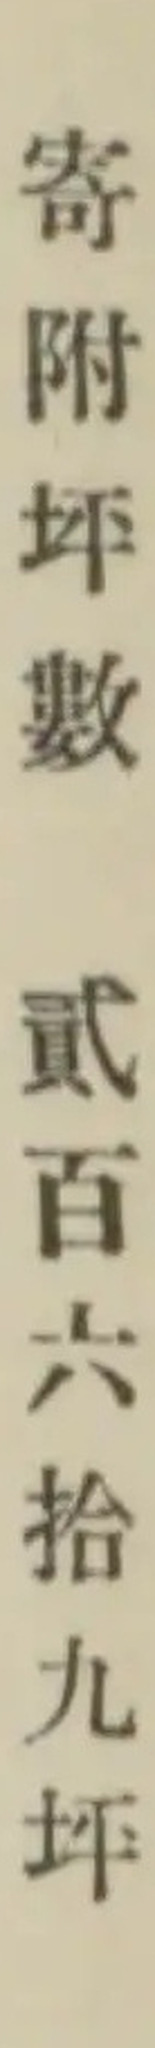寄付坪数貳百六拾九坪
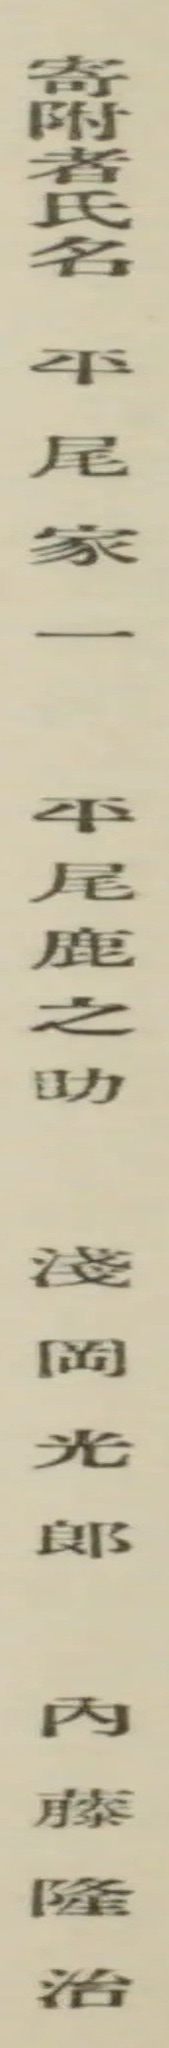寄付者氏名平尾家一平尾鹿之助淺岡光郎内藤隆治
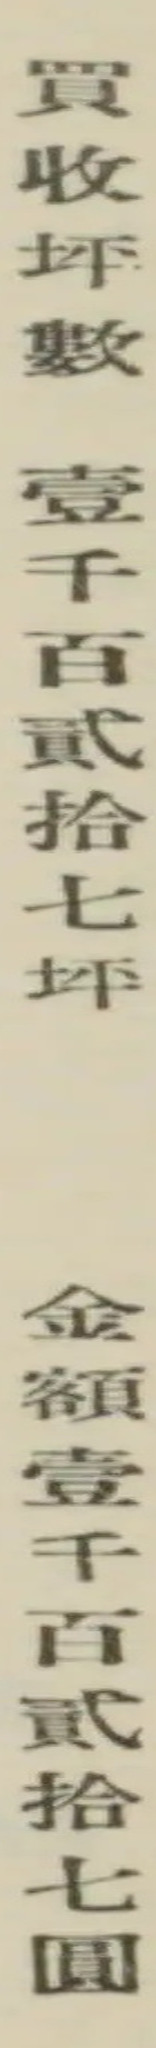買収坪数壹千百貳拾七坪金額壹千百貳拾七圓
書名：豊橋市水道誌
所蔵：国立国会図書館 National Diet Library, JAPAN
